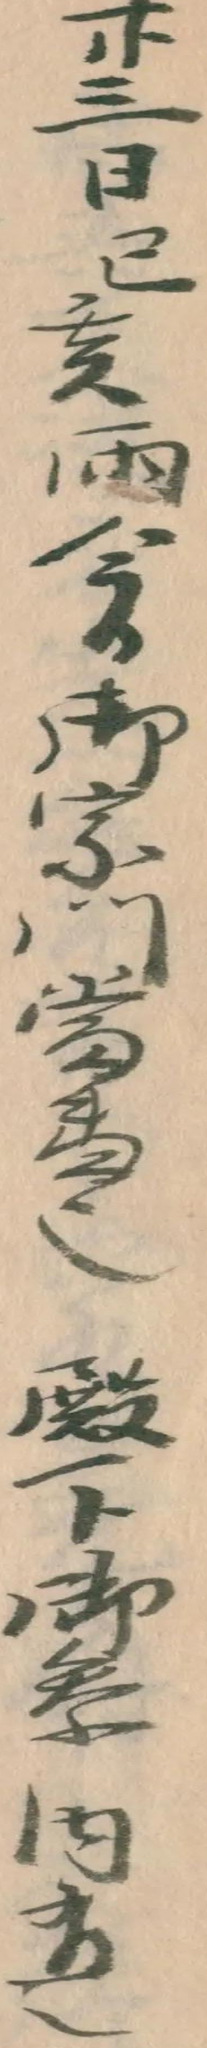廿三日己亥雨今日御家門當番也殿下御参内有之
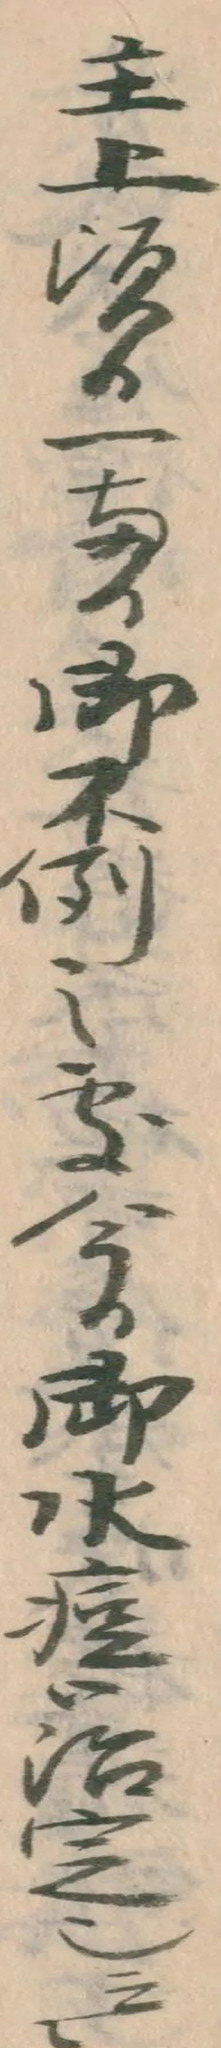主上頃日一両日御不例之處今日御水痘御治定也云々
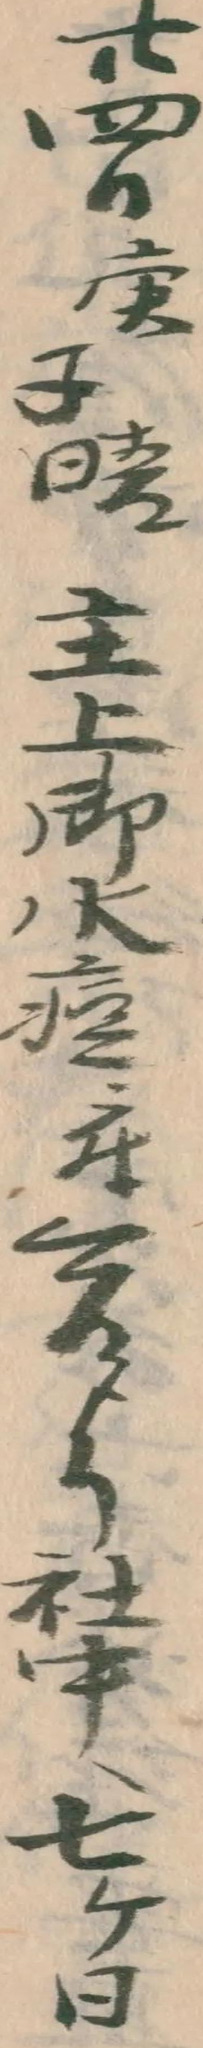廿四日庚子晴主上御水痘ニ付今日より社中へ七ケ日
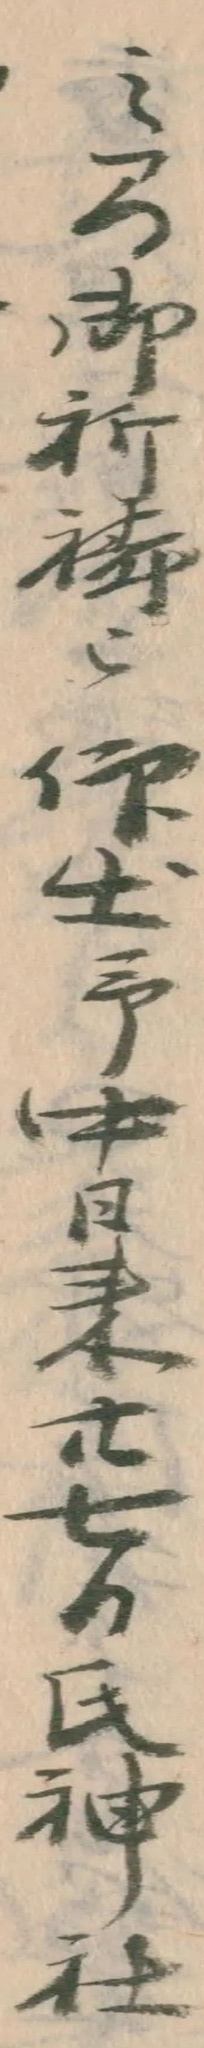之間御祈祷被仰出予中日来廿七日氏神社
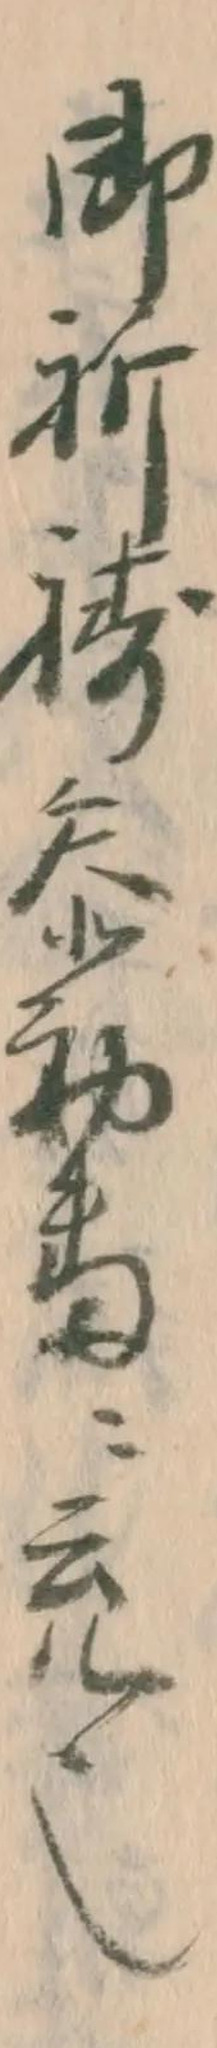御祈祷参勤番に充也
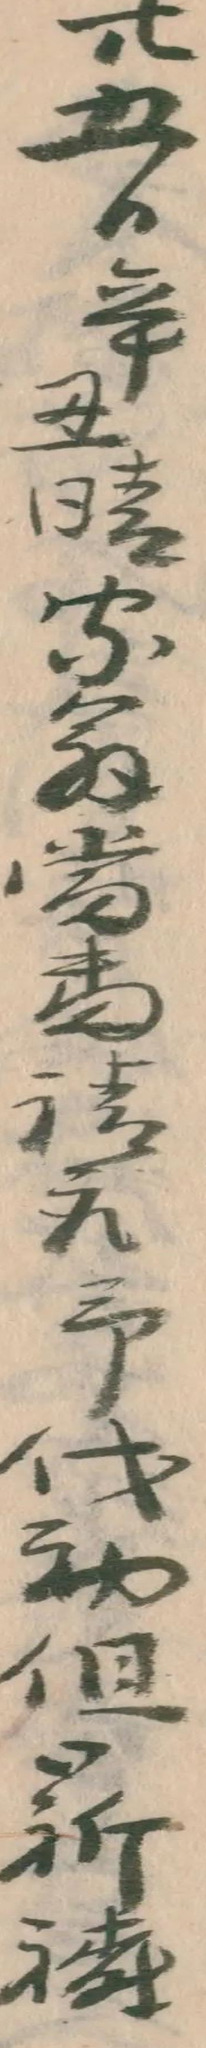廿五日辛丑晴家翁當番請取予代勤但御祈祷
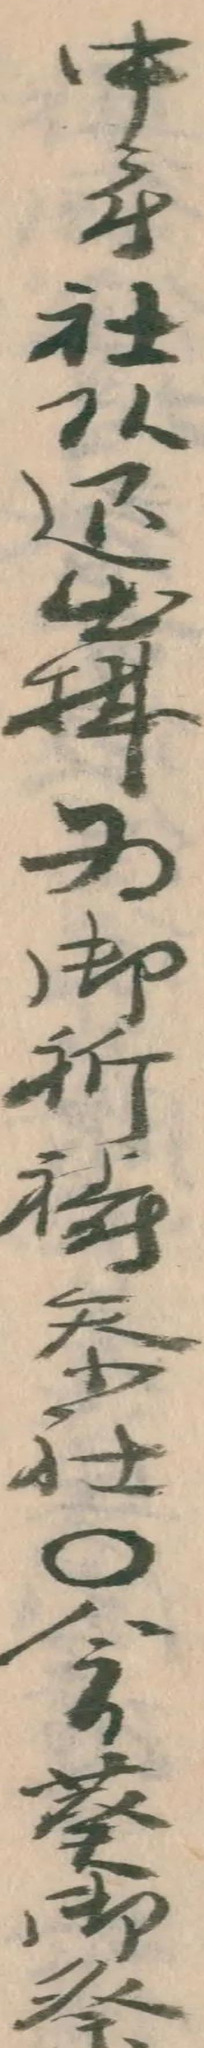中ニ付社頭退出掛為御祈祷参社○今日葵御祭
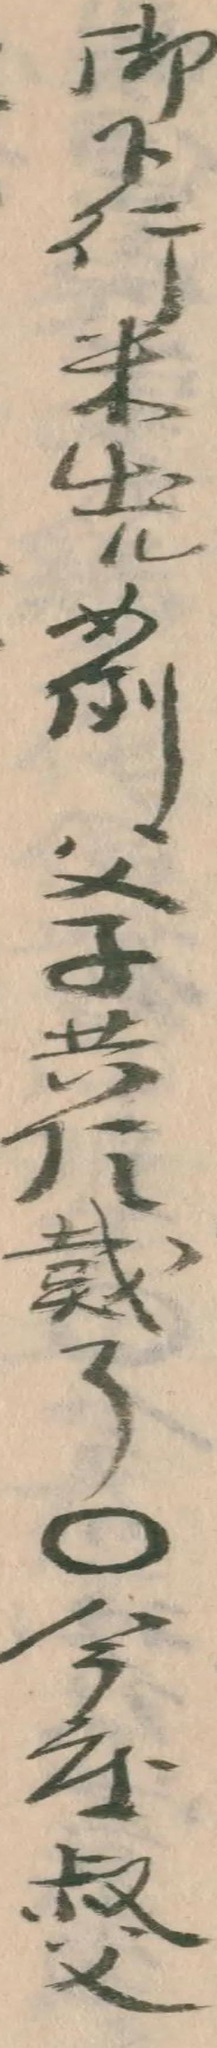御下行米出ル如例父子共頂戴了○今度叔父
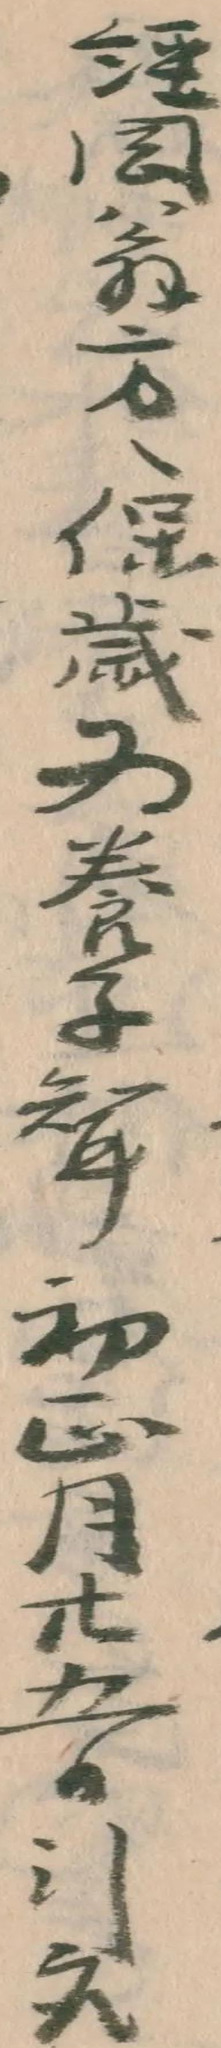経岡翁方へ保歳為養子聟初正月廿五日引取
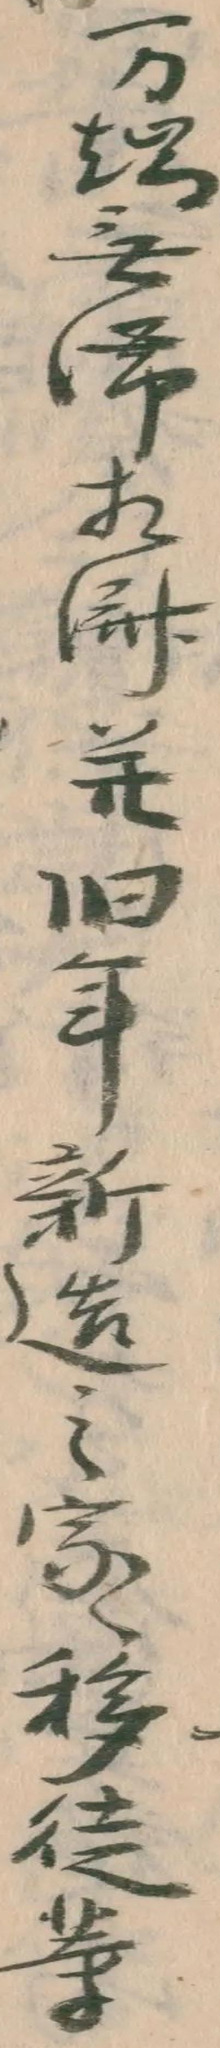万端無滞相済并旧年新造之家へ移徒等
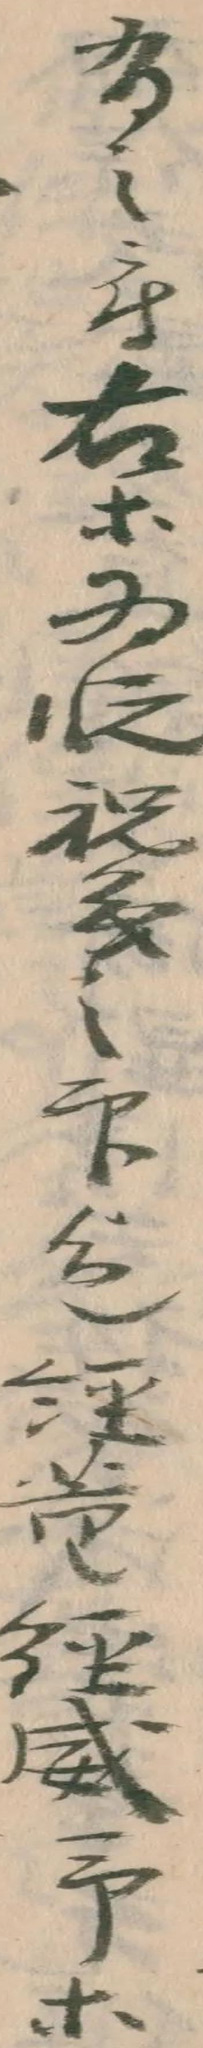有之ニ付右等為悦祝義之印迄経董経威予等
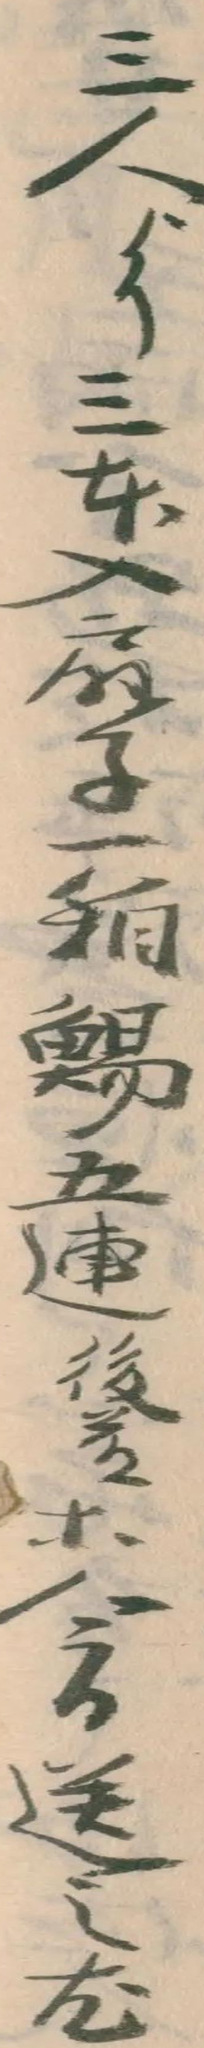三人より三本入扇子一箱鯣五連後藤等今日送之尤
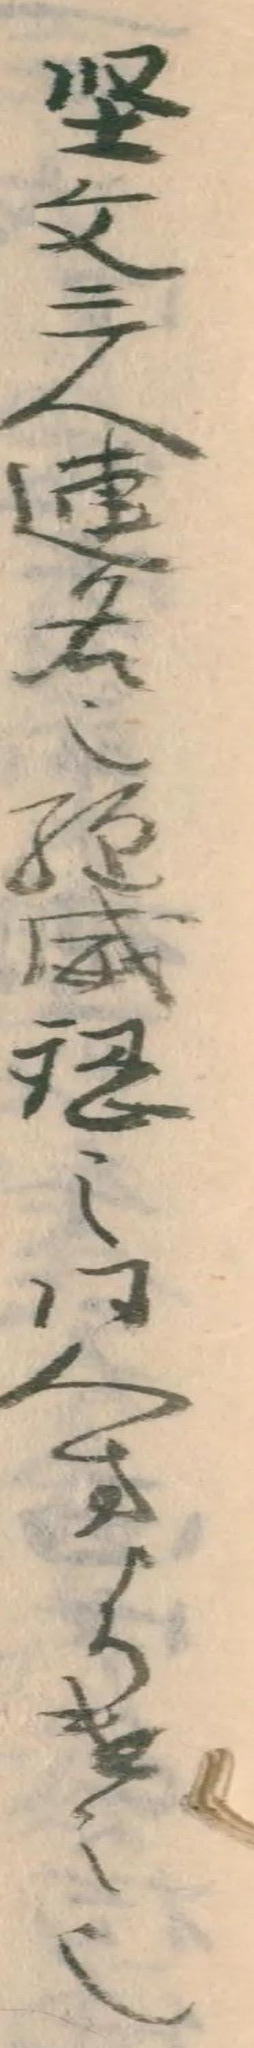堅文三人連名也経威認之同人方より遣之也
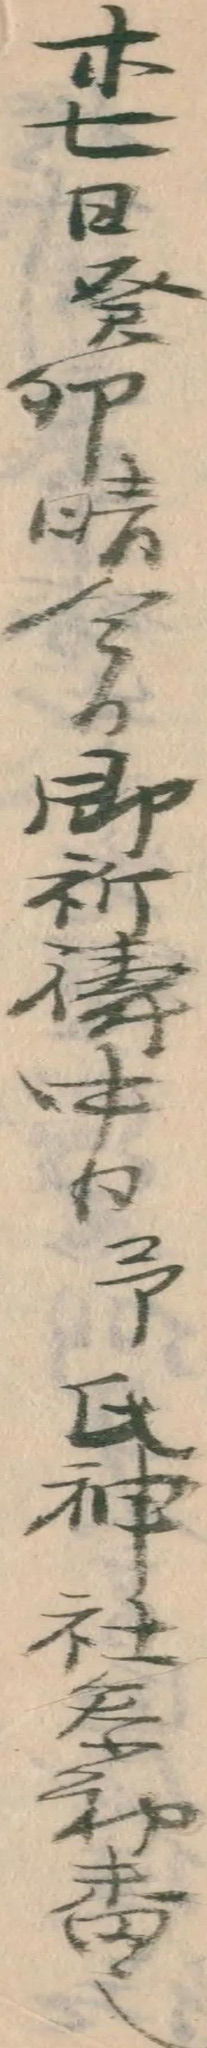廿七日癸卯晴今日御祈祷中日予氏神社参勤番也
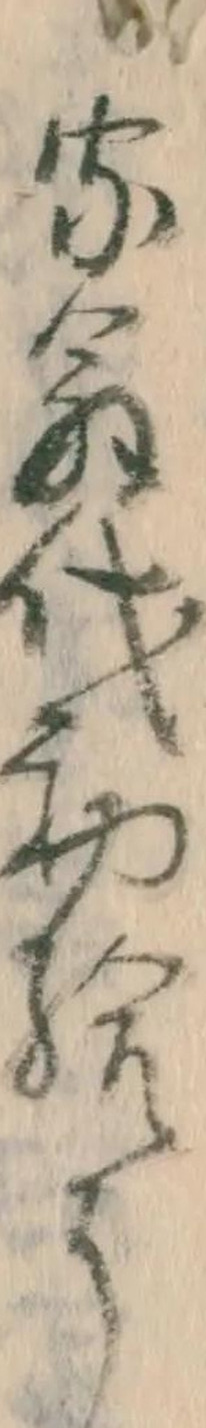家翁代勤給了
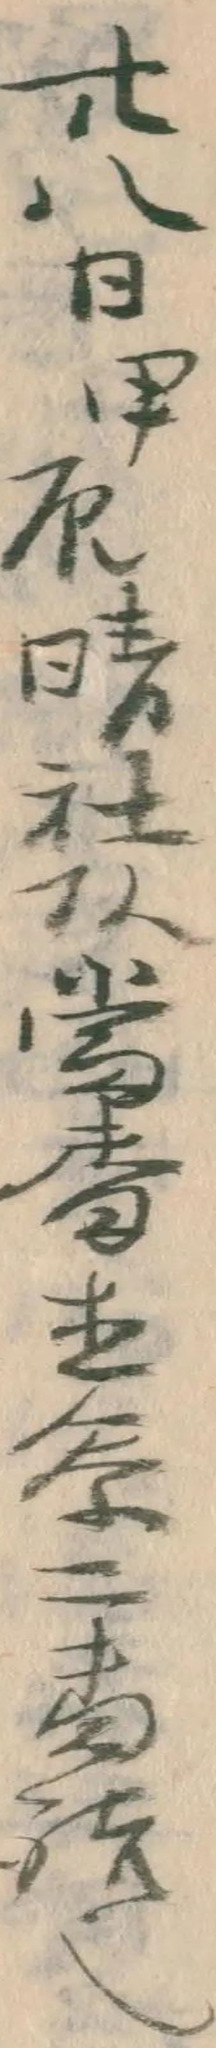廿八日甲辰晴社頭當番直會二番請也
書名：賀茂社記録. 第63冊
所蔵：国立国会図書館 National Diet Library, JAPAN
